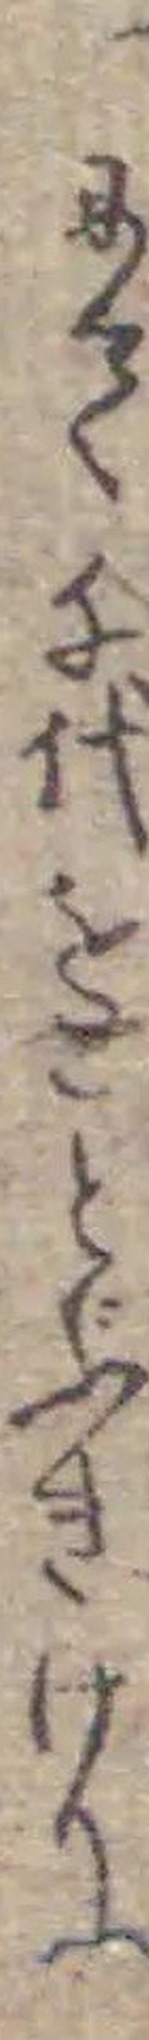にて千代をことぶきけり

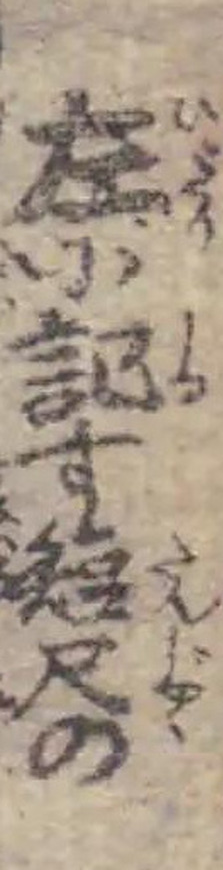左に記す短尺の
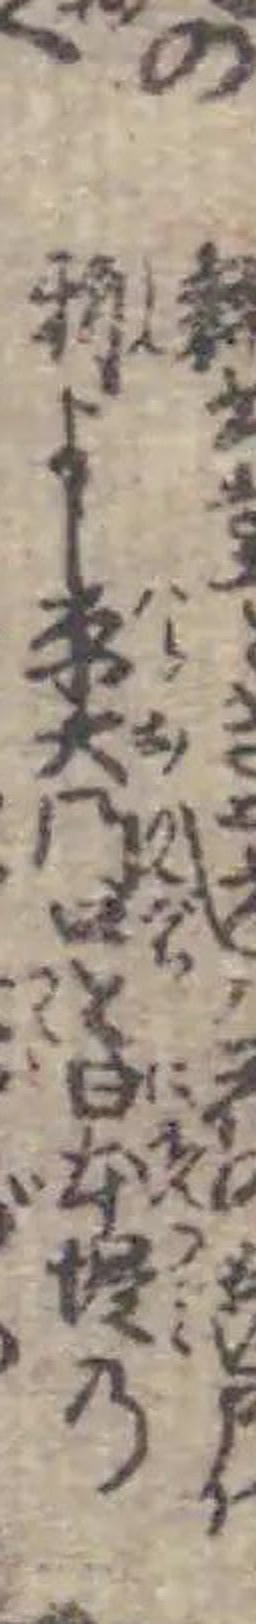新よし原大門口と日本堤の
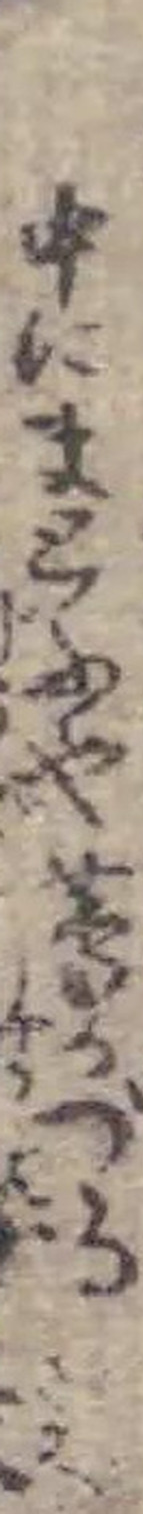中にまとふや蔦かづら
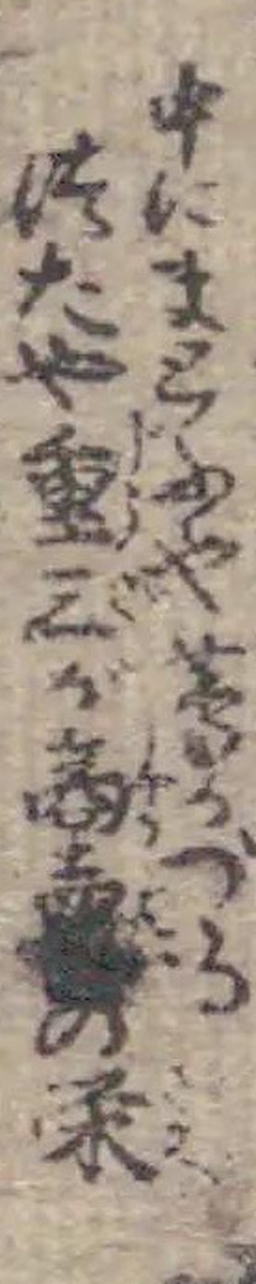つたや重三が商売の栄
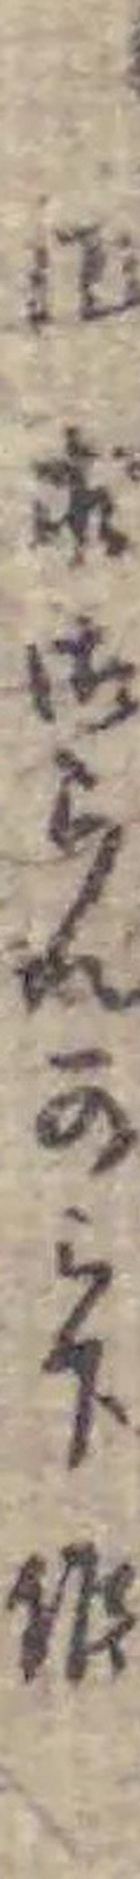御求御らん可被下候
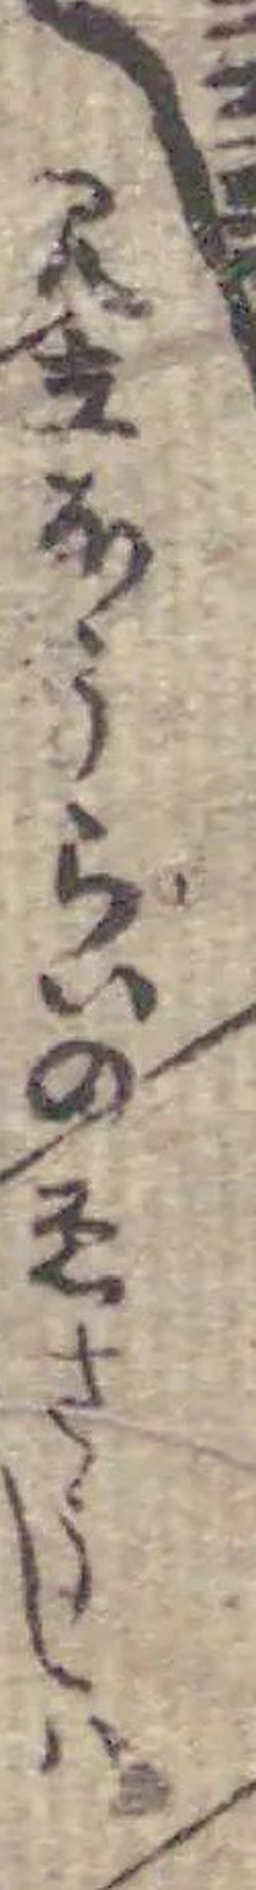見立ほうらいのゑさうしは
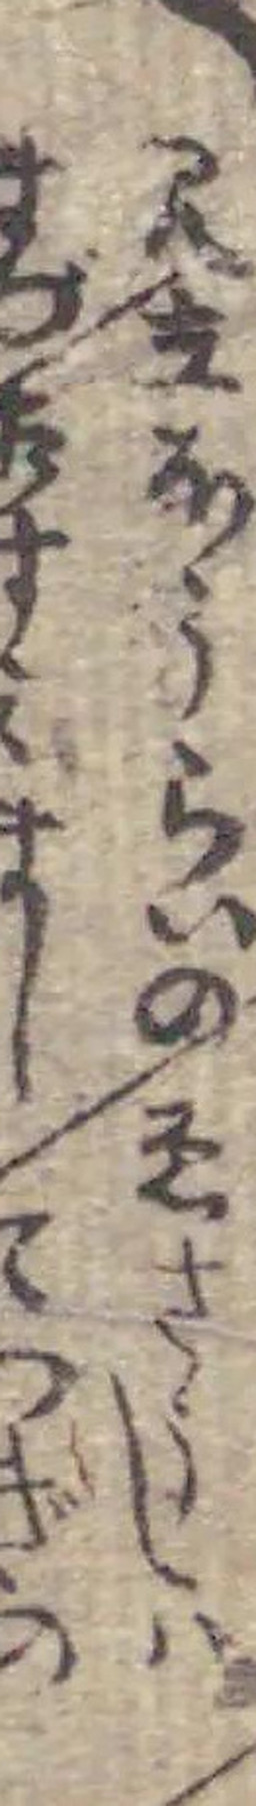まづ相すみましてつぎの
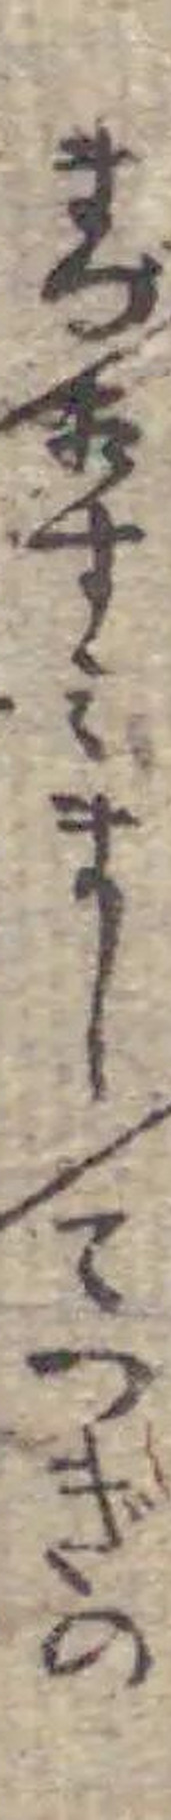まづ相すみましてつぎの
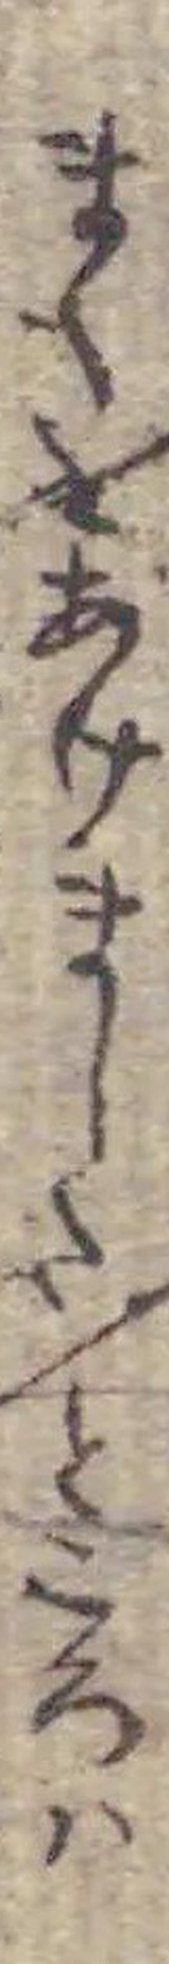まくをあけましたところは
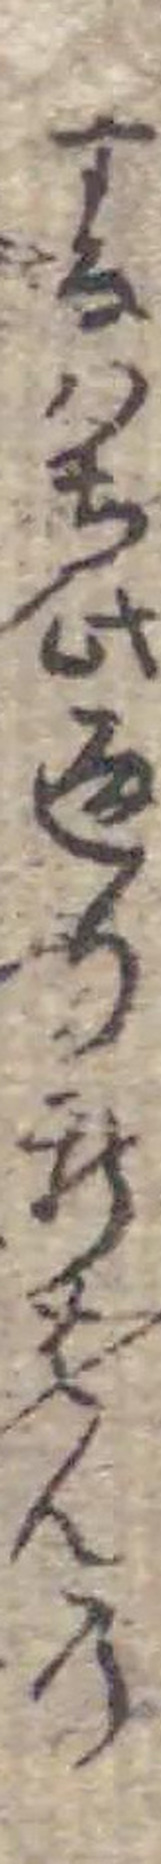すなはち此通り新はんの
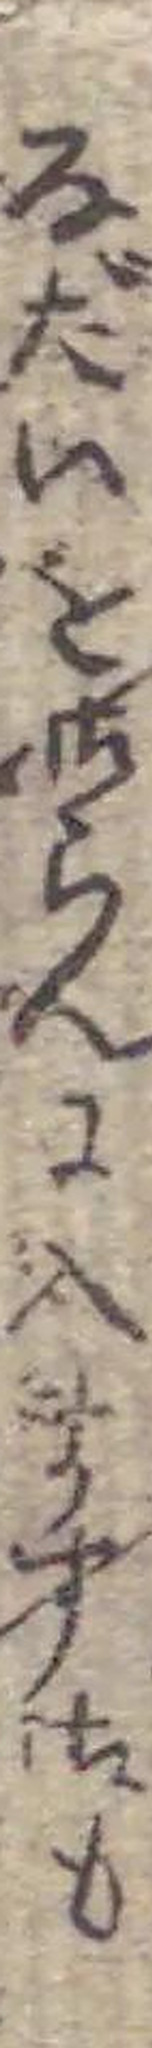なだいを御らんに入ます御も
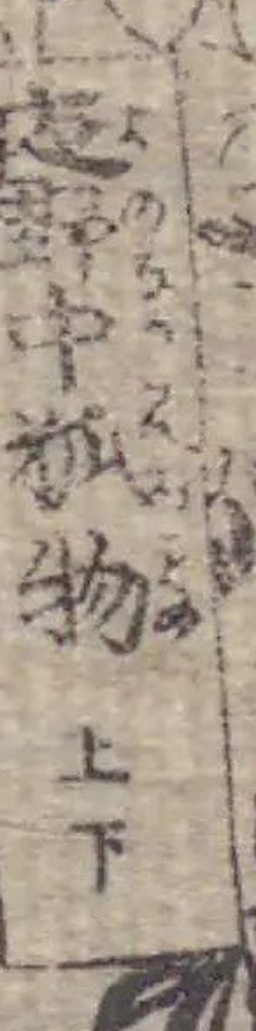夜野中狐物上下
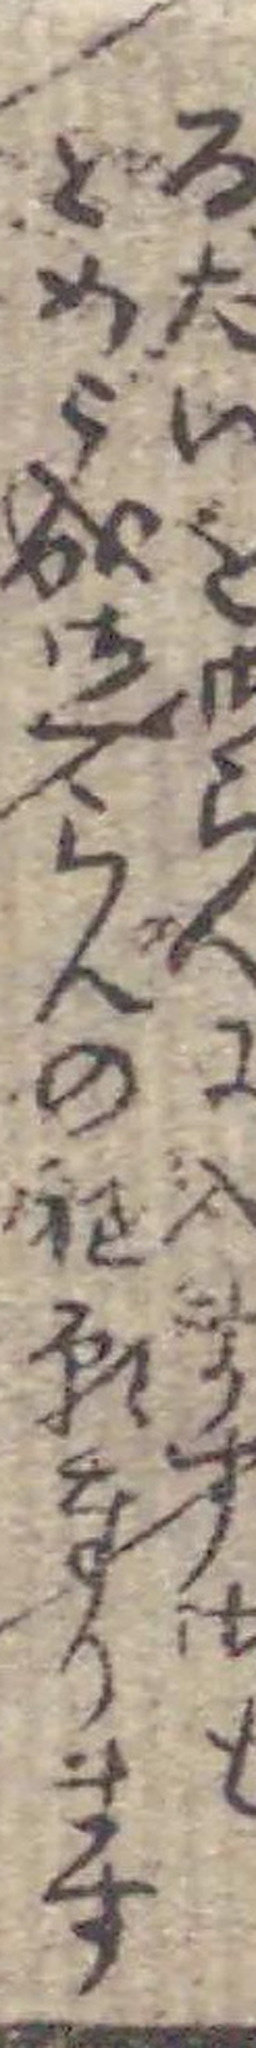とめ被成御らんの程頼奉ります
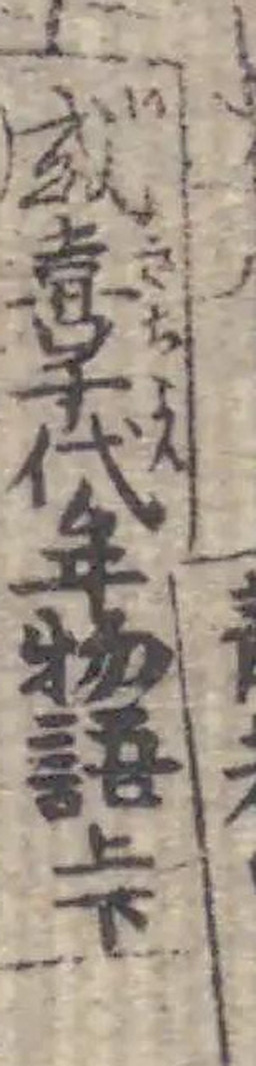威喜千代牟物語上下
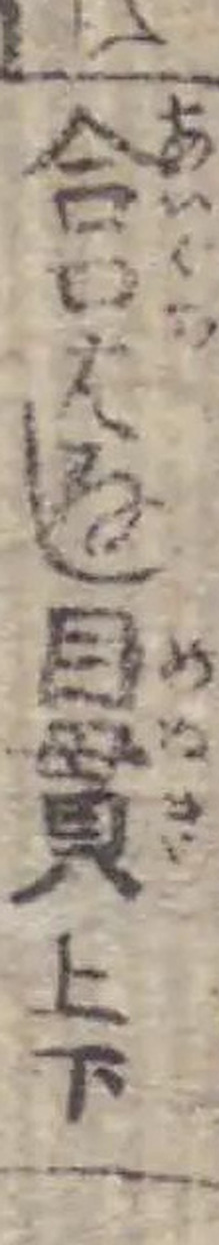合口はなし目貫上下
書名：見立蓬莱 : 2巻
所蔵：国立国会図書館 National Diet Library, JAPAN
